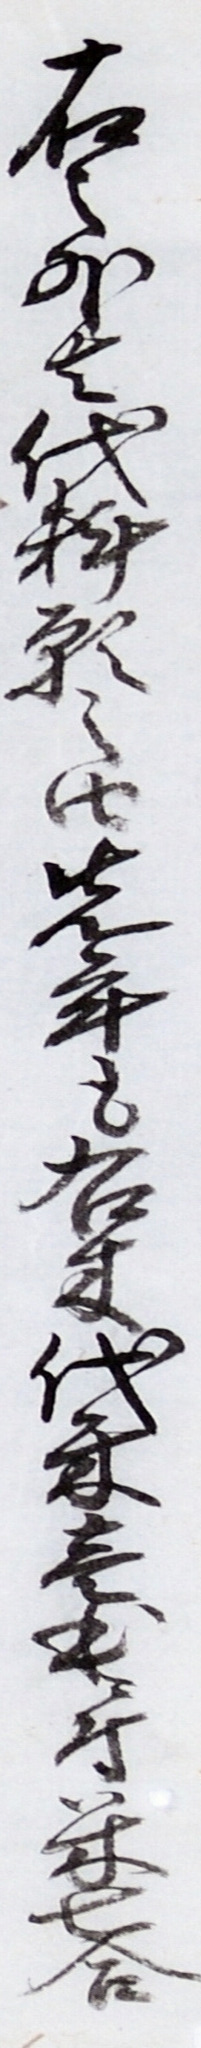右之外は代料願之由先年も右米代米壱匁二付米七合
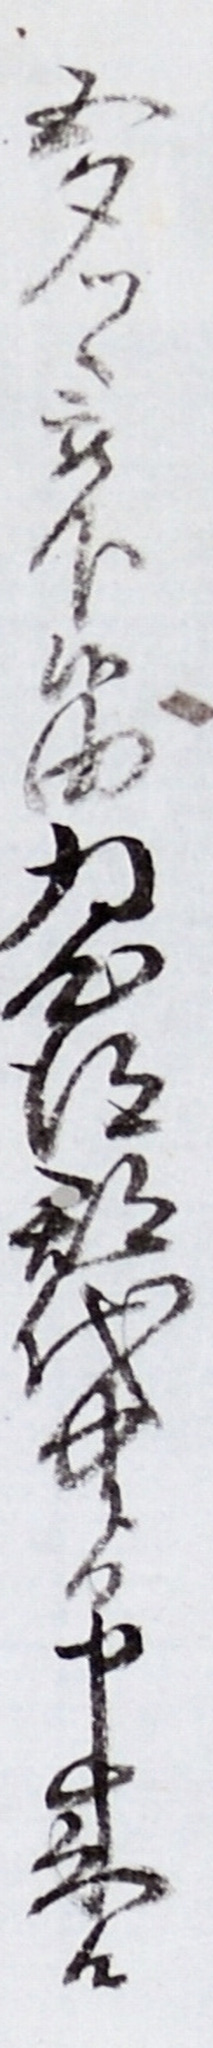五名へ被下候由為心得郡代中より申来候
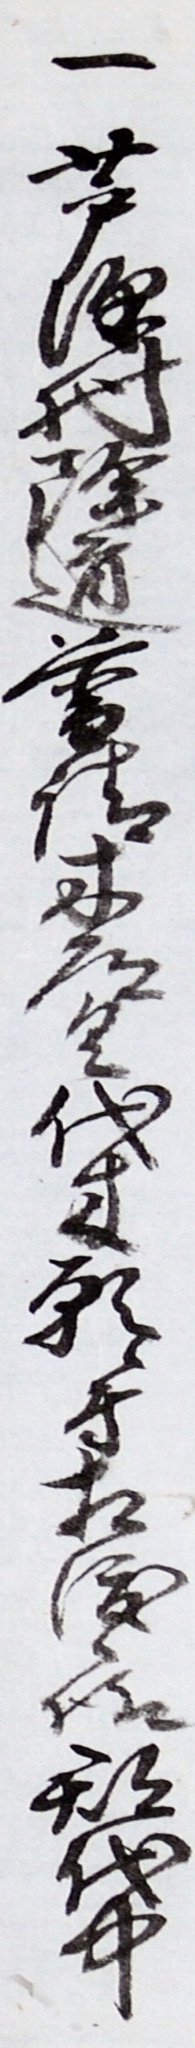一芦澤村除道普請木道具代木願ニ付相渡候様郡代中
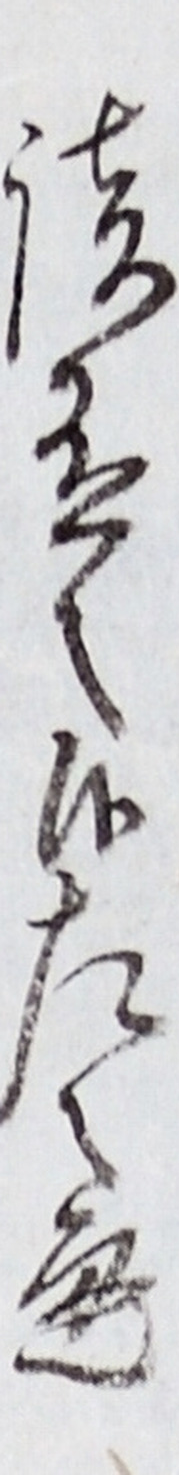談有之候左之通
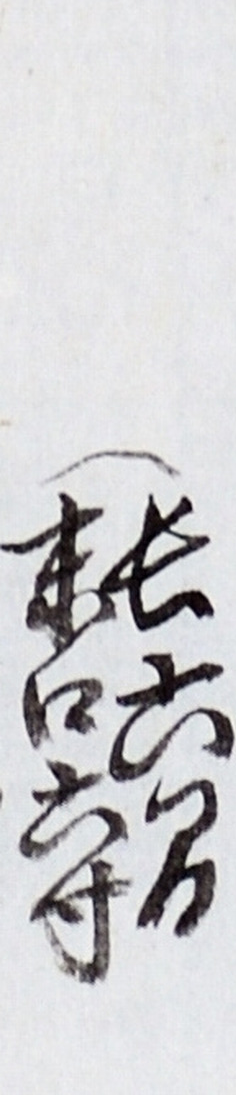末口六寸
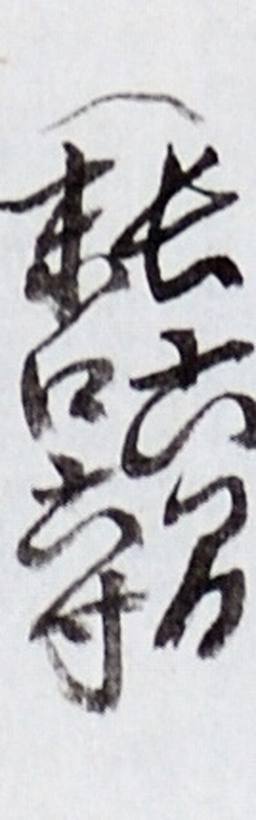末口六寸
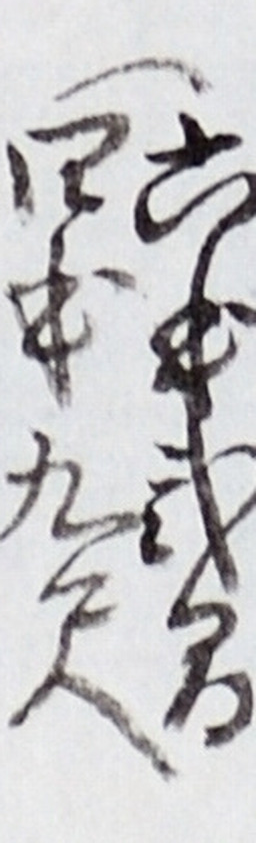四本九尺
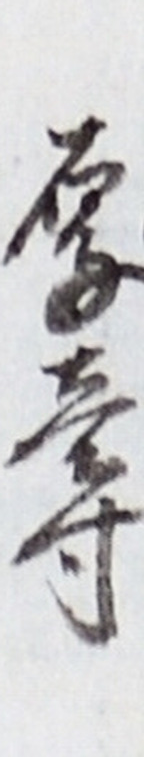厚壱寸
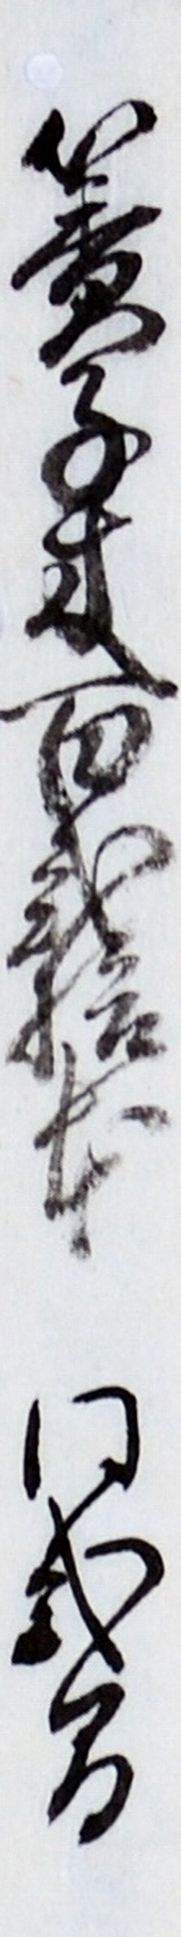簀子木百弐拾本同弐間
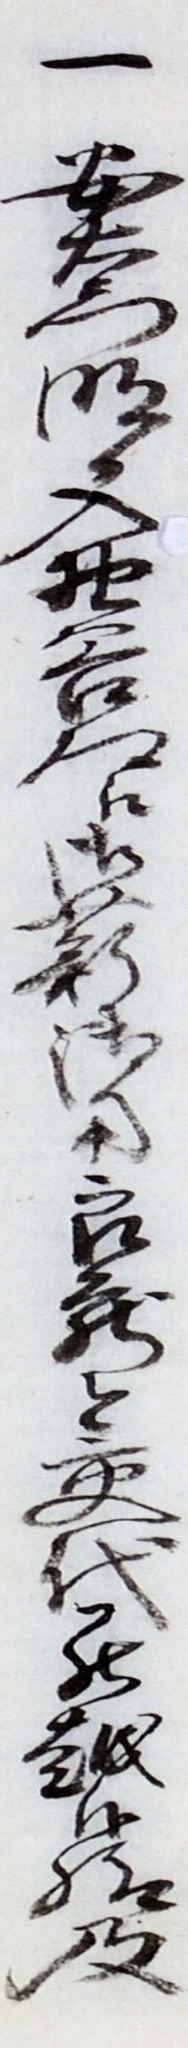一安右衛門明日入野谷郷江御薪御用良蔵を交代罷越候様及
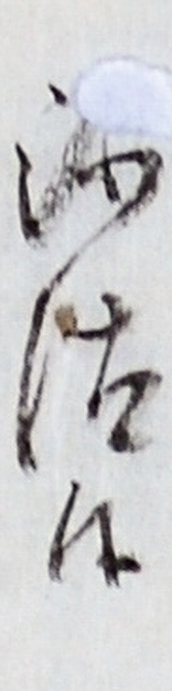沙汰候
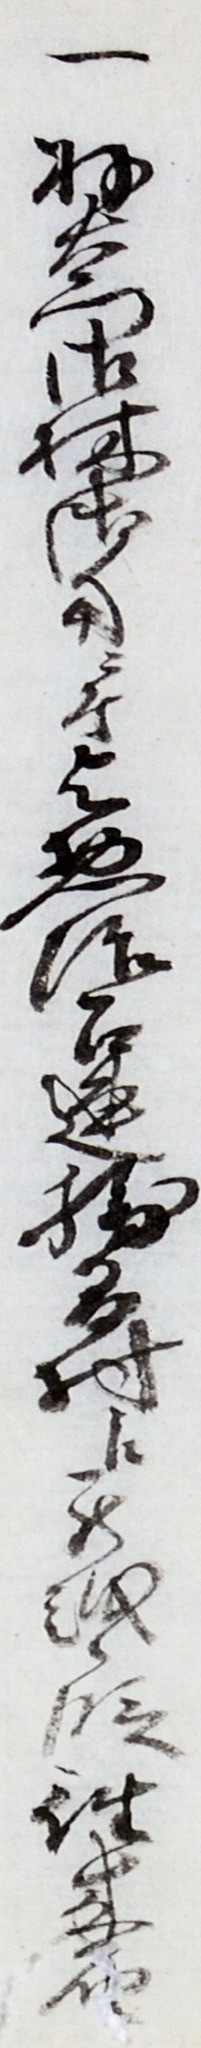一羽右衛門御林御用ニ付与惣治召連勝間村江罷越候段往来届
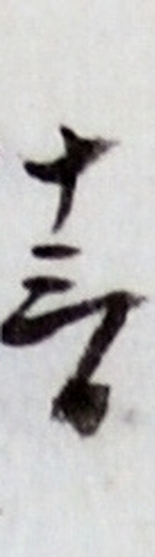十三日
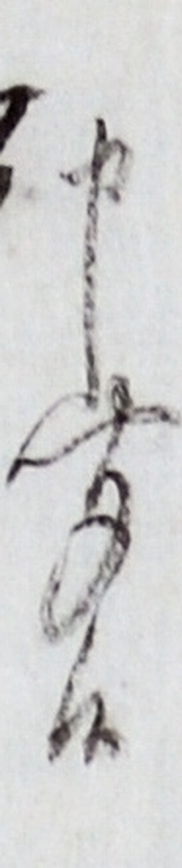申聞候
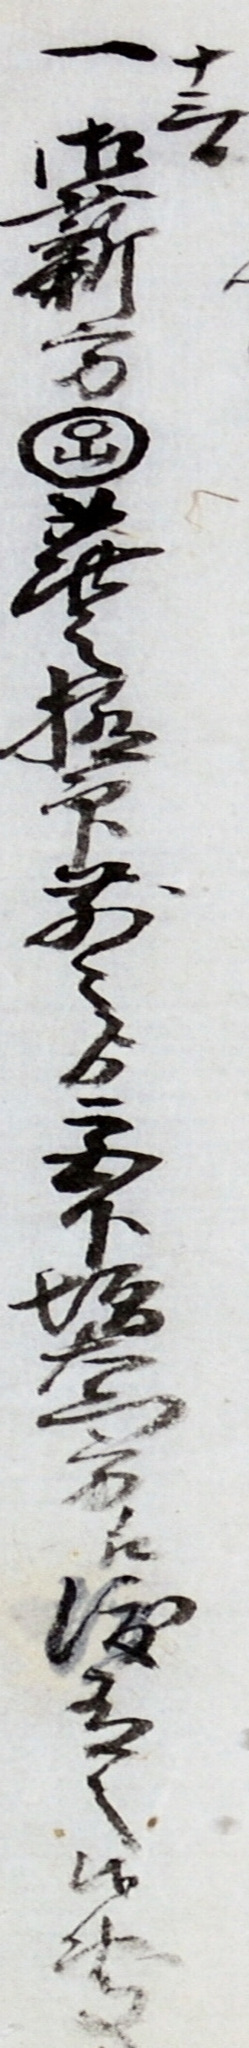一御薪方〇如之極印前々より宮下増右衛門方江渡有之候処
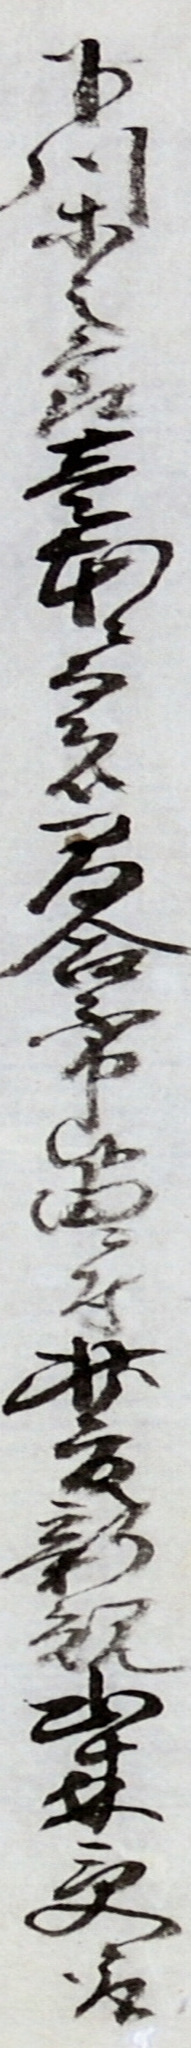下川等之節壱本ニ而は間合不申候由ニ付此度新規弐朱受取
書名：御山奉行御用控
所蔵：伊那市立高遠町図書館・合同会社AMANE
